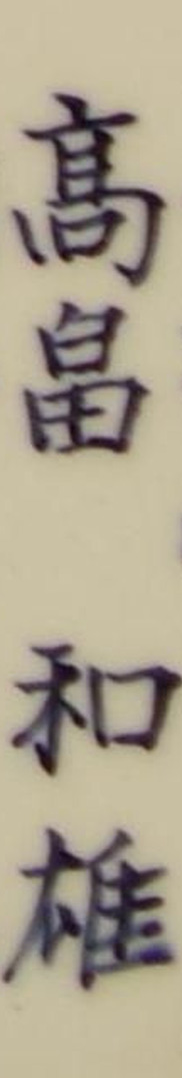高畠和雄
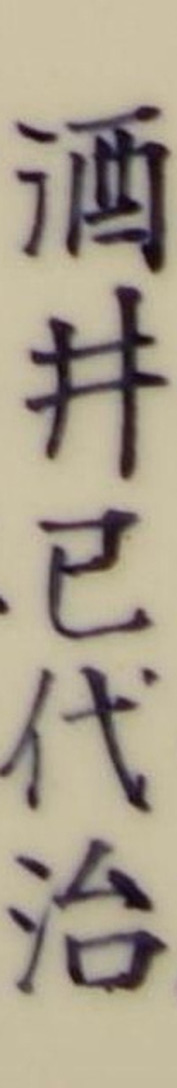酒井巳代治
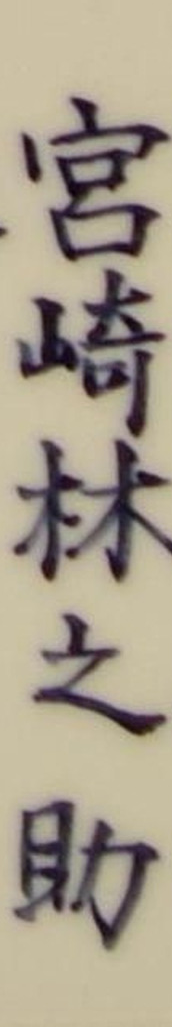宮崎林之助
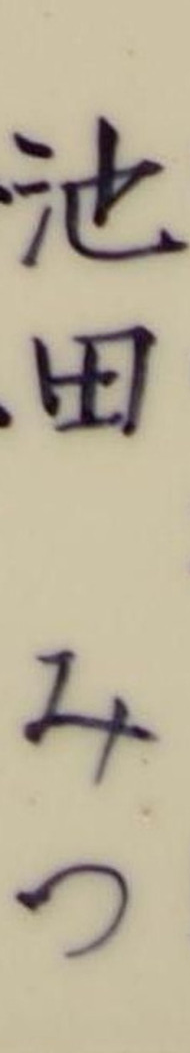池田みつ
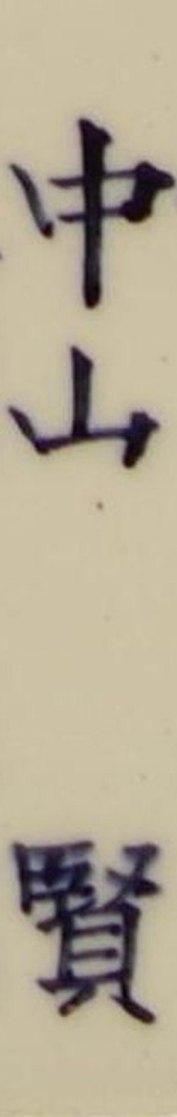中山賢
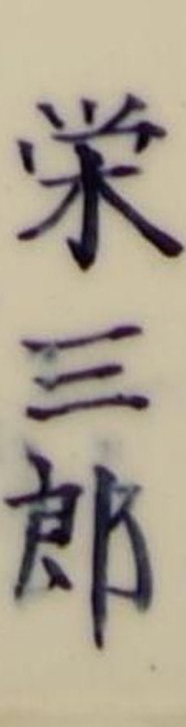栄三郎
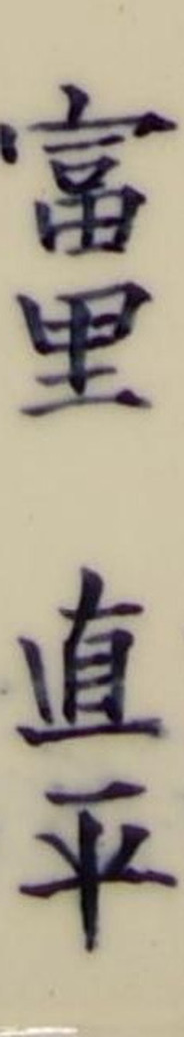富里直平
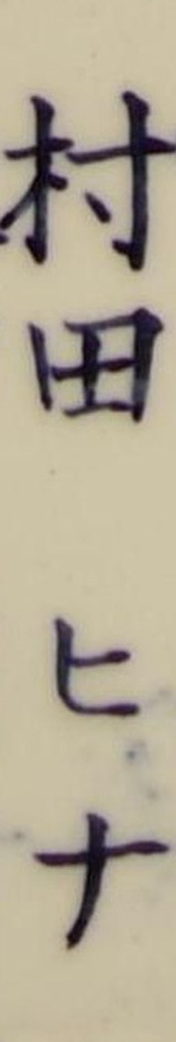村田ヒナ
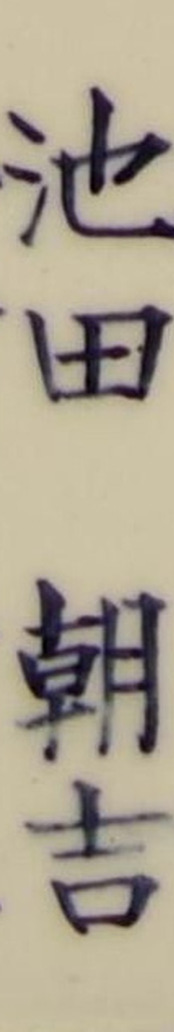池田朝吉
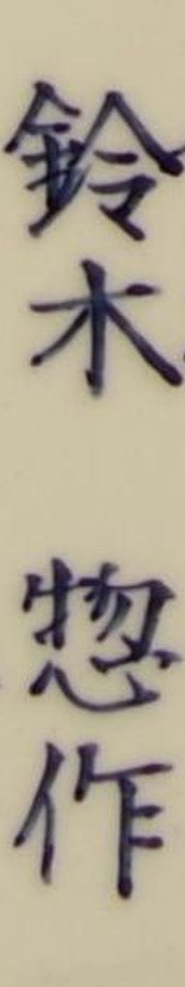鈴木惣作
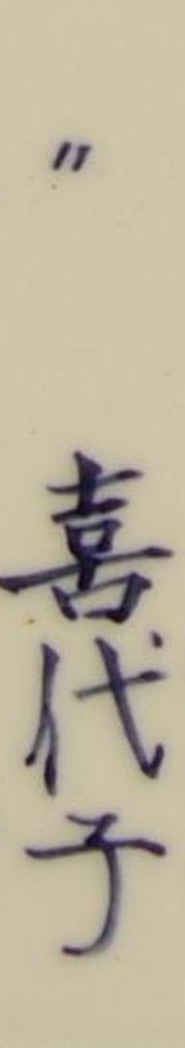喜代子
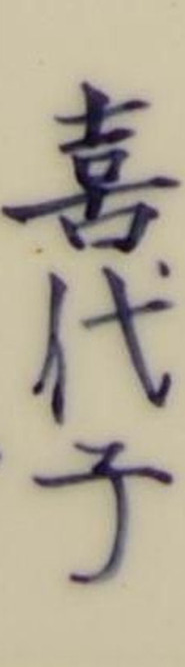喜代子
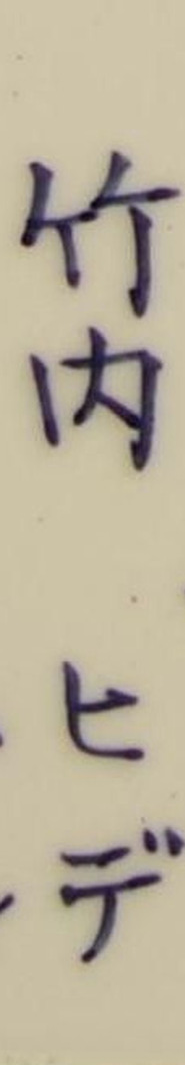竹内ヒデ

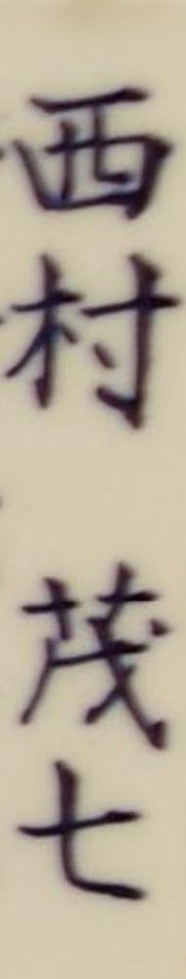西村茂七
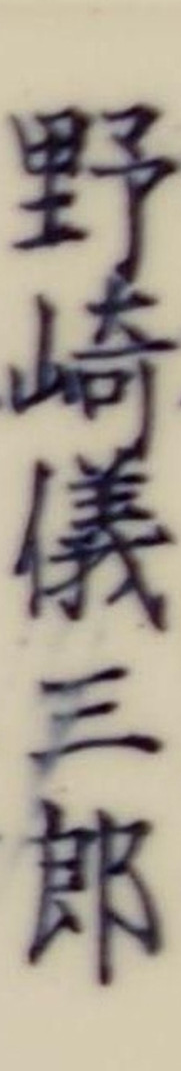野崎儀三郎
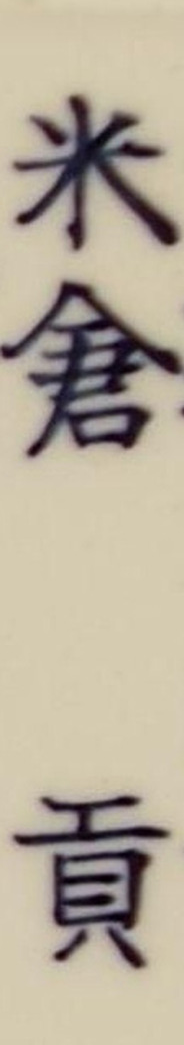米倉貢
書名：E~L
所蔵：高野山金剛峯寺
